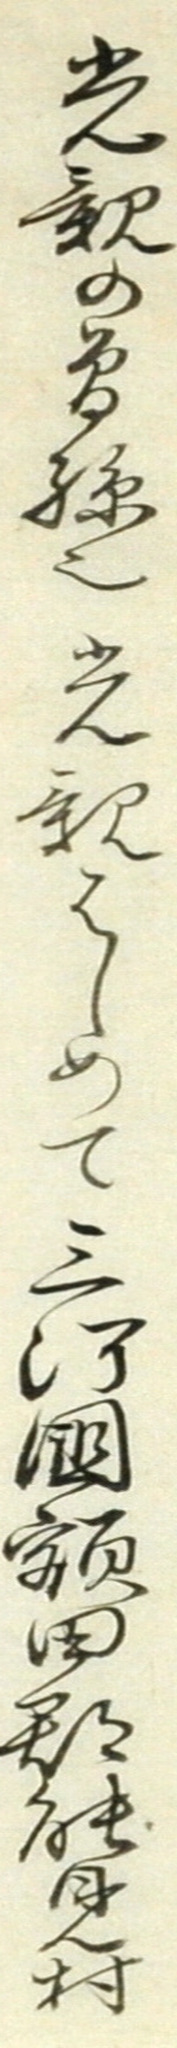光親の曽孫也光親はしめて三河国額田郡能見村
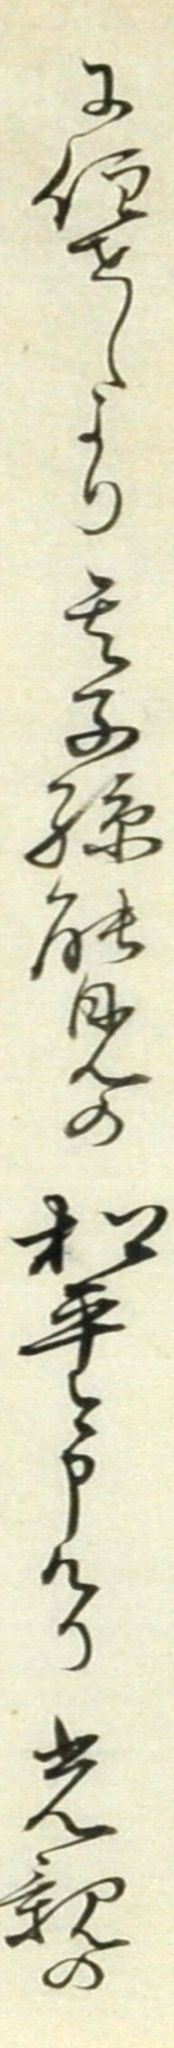に住せしより其子孫能見の松平と申けり光親の
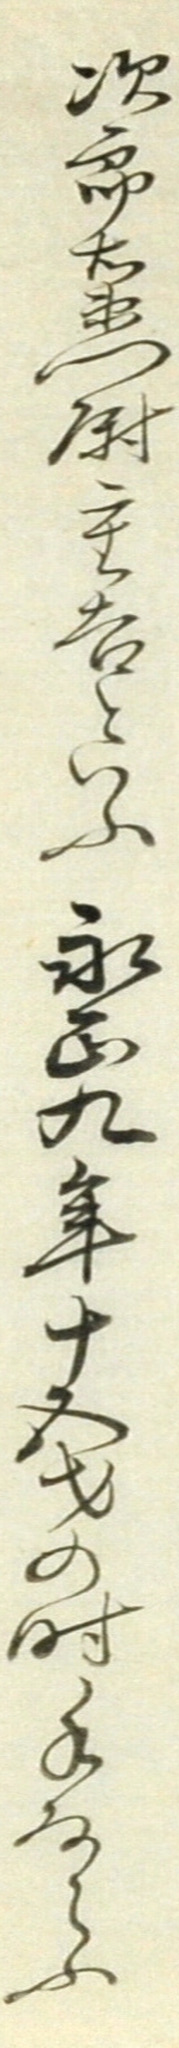次郎右衛門尉重吉といふ永正九年十五才の時手ならふ
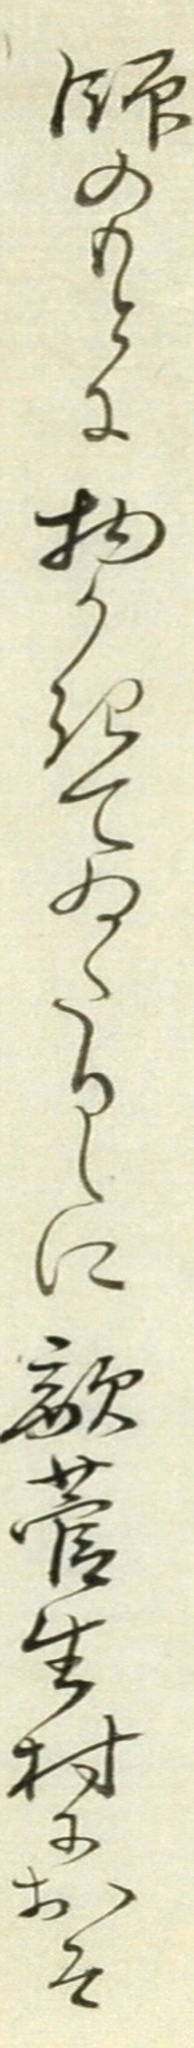師のもとに物かきてゐたりしに敵菅生村におそ
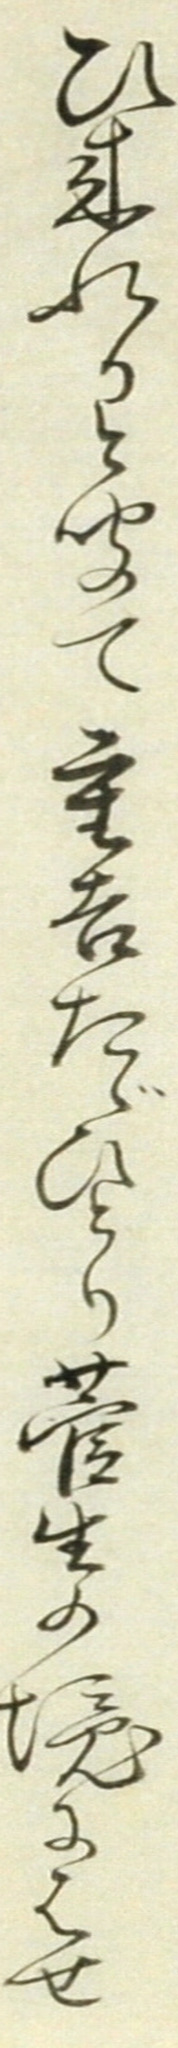ひ来れりと聞て重吉たゞひとり菅生の境にはせ
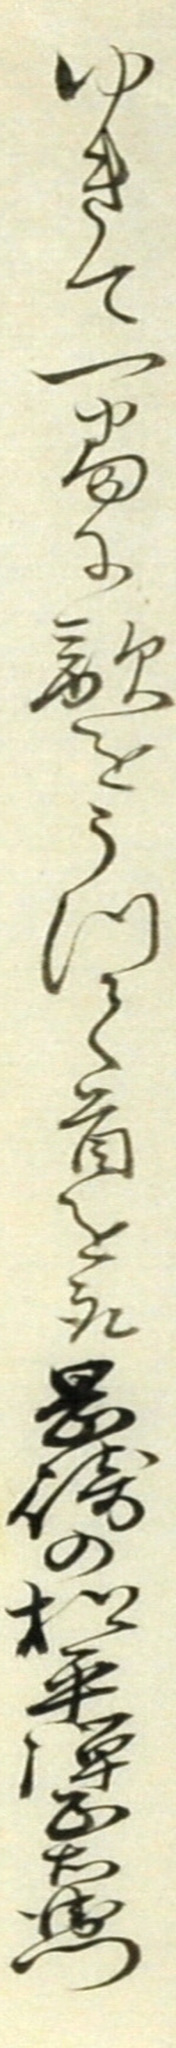ゆきて一番に敵をうつて首を取岡崎の松平弾正右衛門
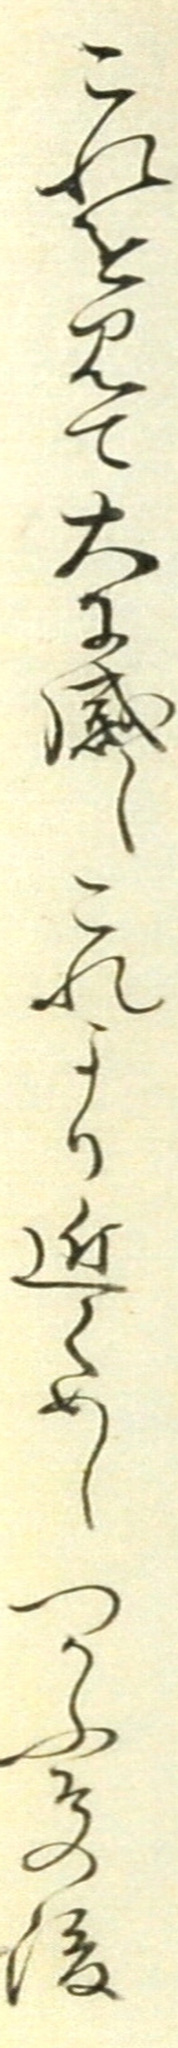これを見て大に感しこれより近くめしつかふその後

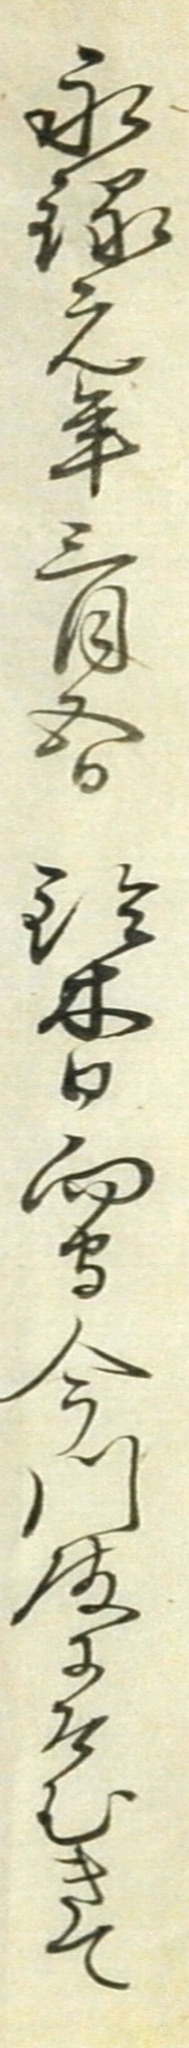永禄元年三月五日鈴木日向守尾今川殿にそむきて
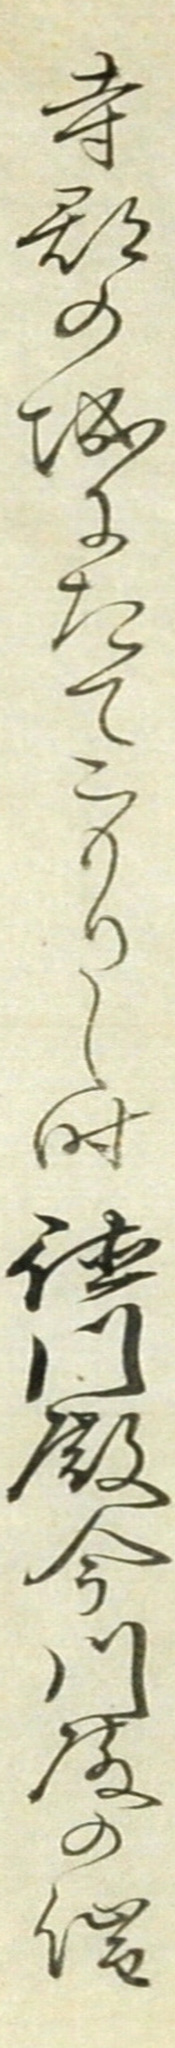寺部の城にたてこもりし時徳川殿今川殿の催
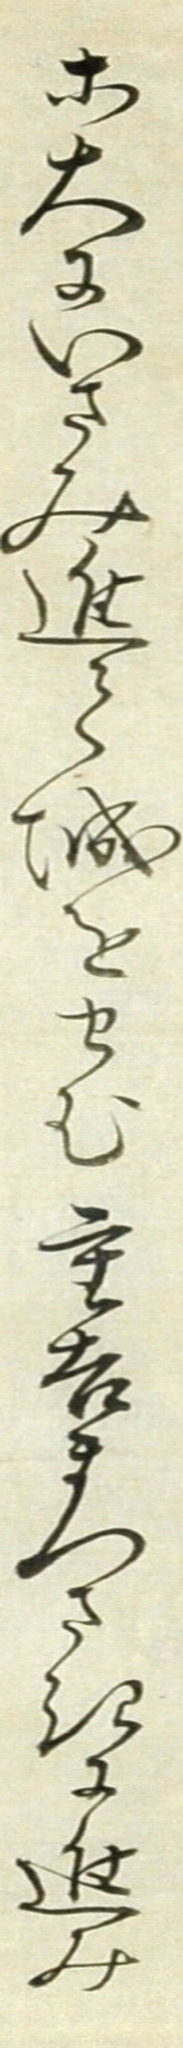等大にいさみ進て城をせむ重吉まつさきに進み
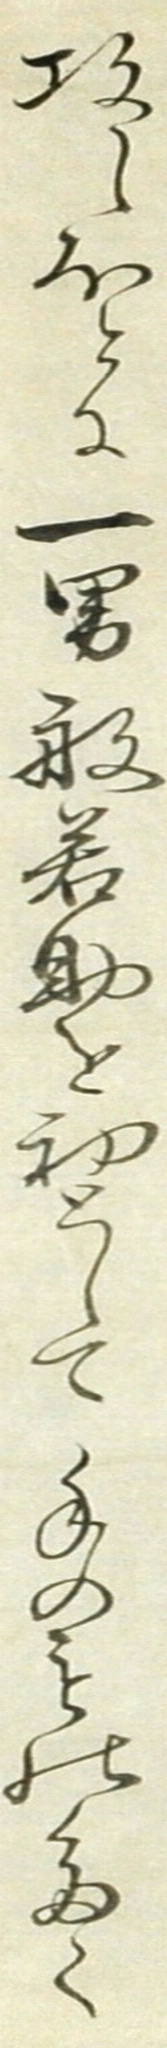攻しほとに一男般若助を初として手のもの多く
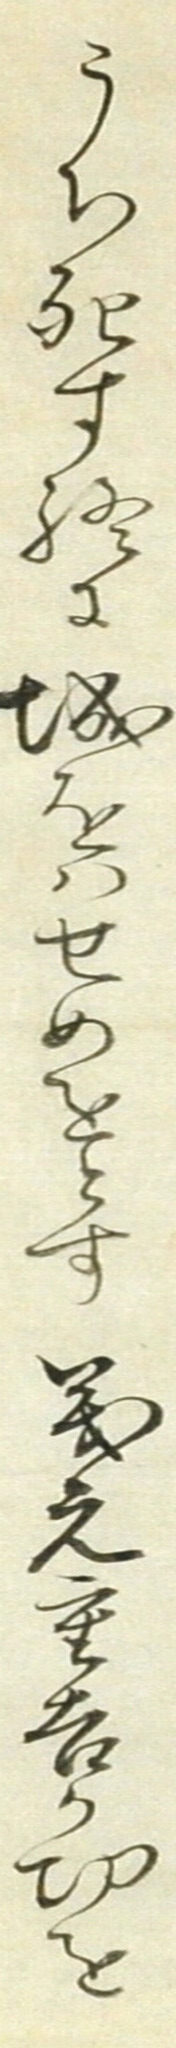うち死す終に城をはせめをとす義元重吉か功を
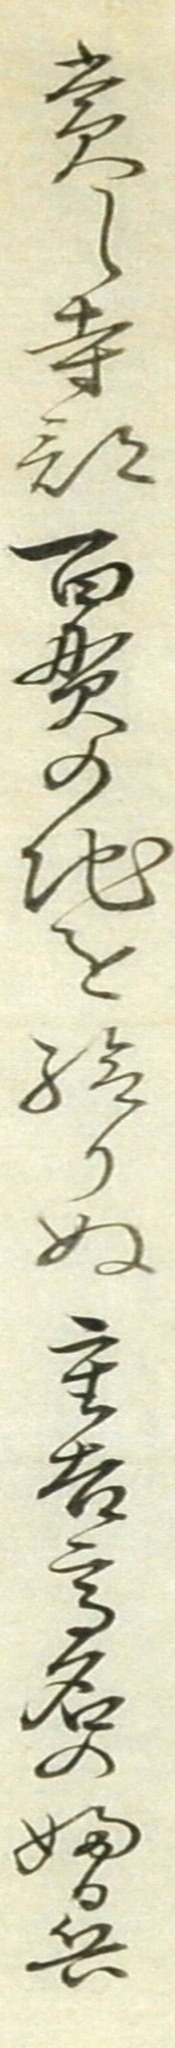賞し寺部百貫の地を給りぬ重吉高名のふる兵
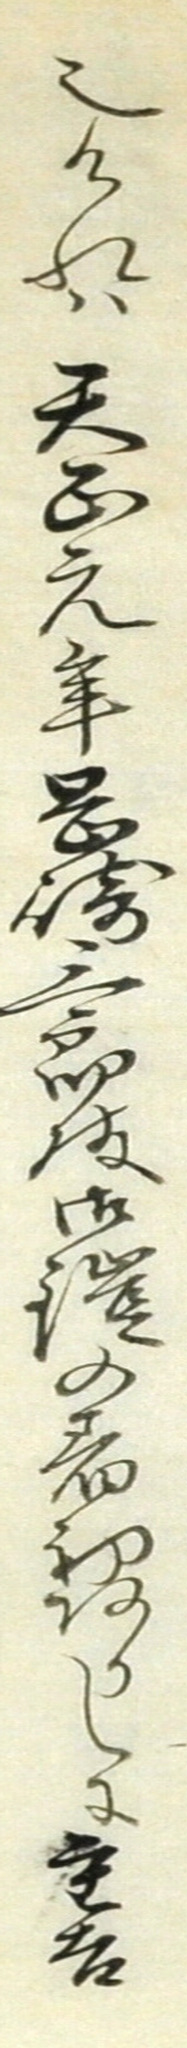也けれは天正元年岡崎三郎殿御鎧の着初ありしに重吉
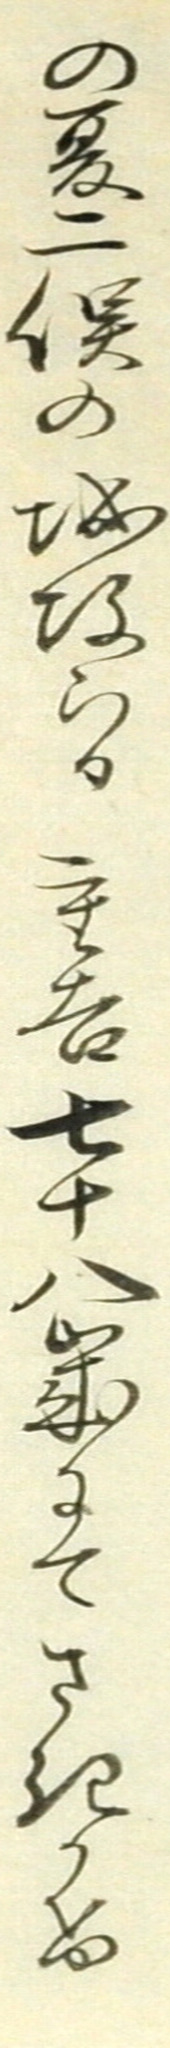の夏二俣の城攻らる重吉七十八歳にてさきかけ
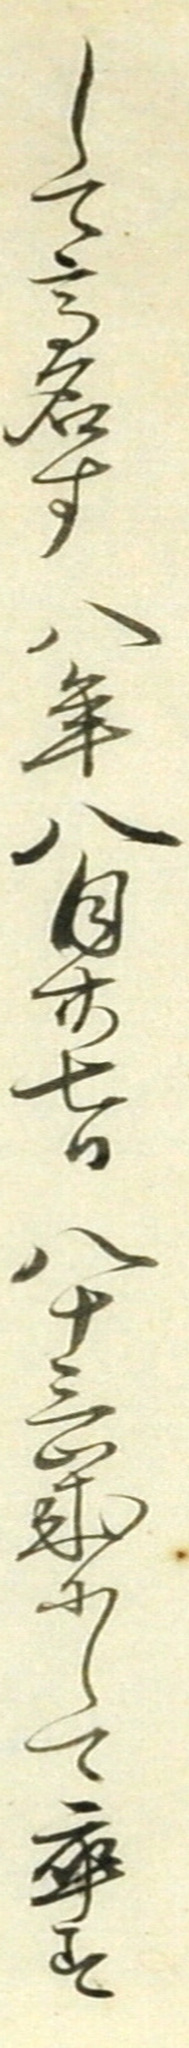して高名す八年八月廿七日八十三歳にして卒す
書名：藩翰譜（二・三）
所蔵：伊那市立高遠町図書館・合同会社AMANE
